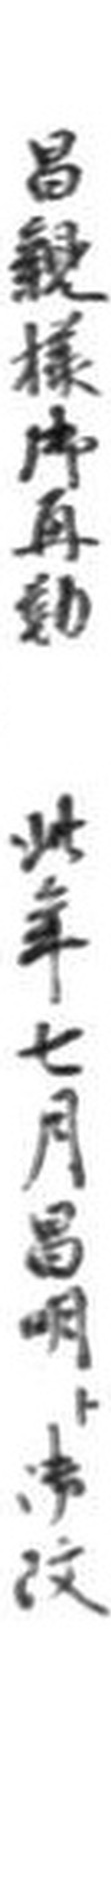昌親様御再勤此年七月昌明御改
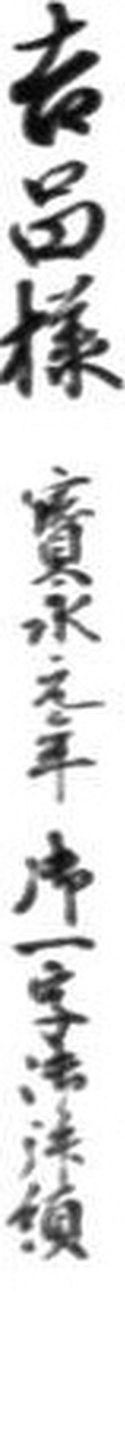吉品様宝永元年御一字御拝領
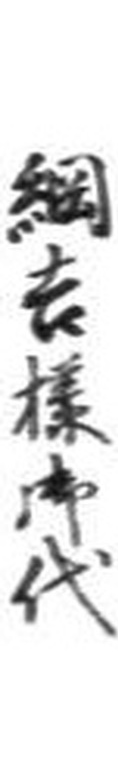綱吉様御代
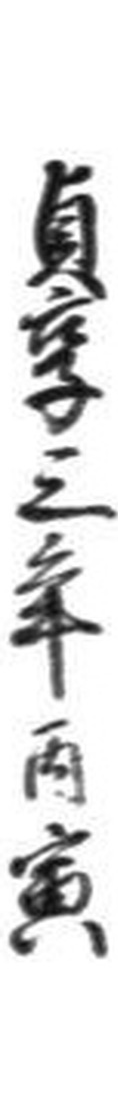貞享三年丙寅

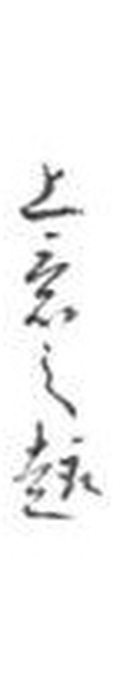上意之趣
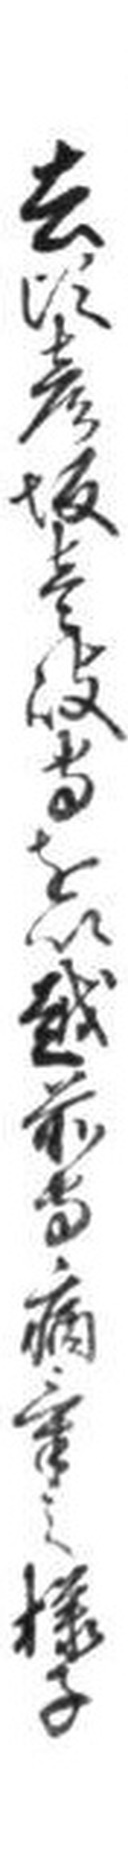去頃彦坂壱岐守を以越前守病気之様子
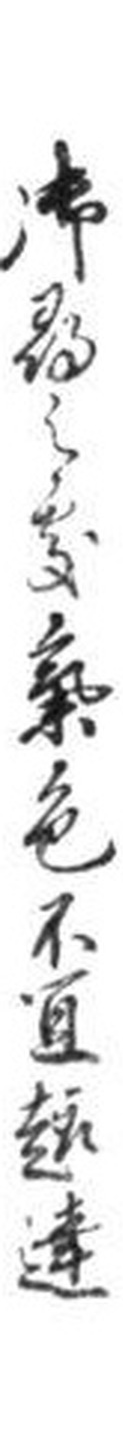御尋之処気色不宜趣達
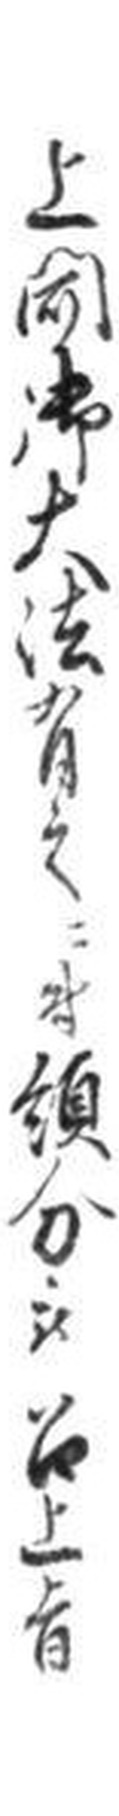上聞御大法有之ニ付領分被召上旨
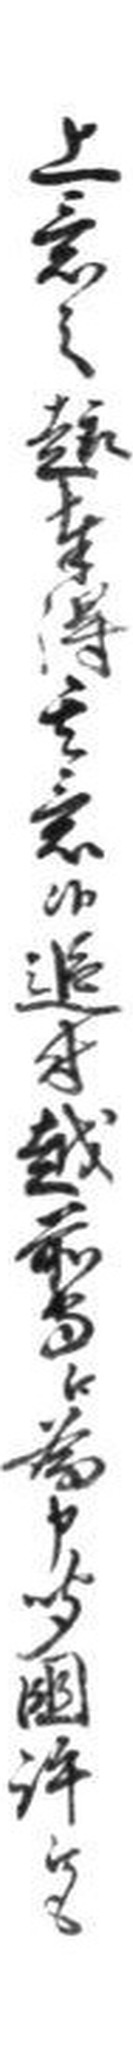上意之趣奉得其意候追付越前守江為申聞国許江も
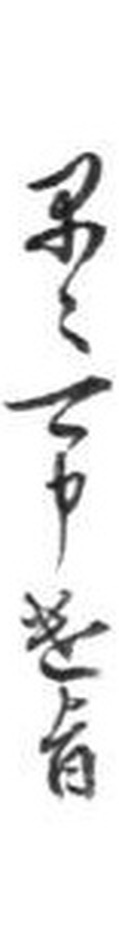早々可申遣旨
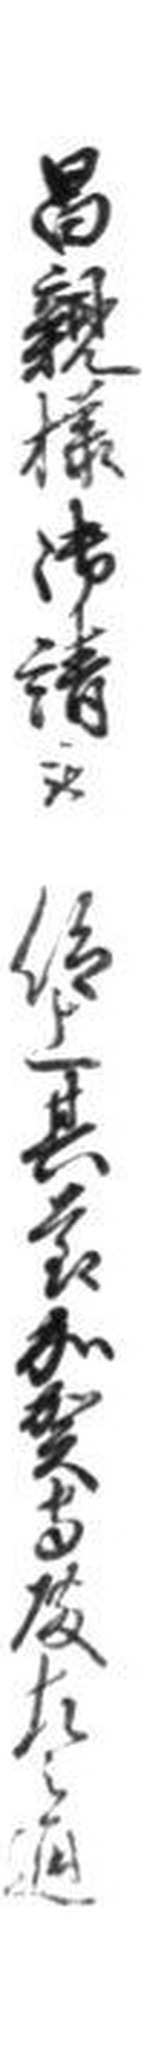昌親様御請被仰上其節加賀守殿左之通
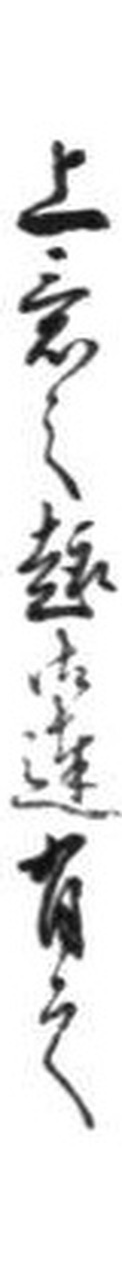上意之趣御達有之
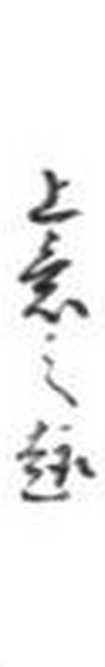上意之趣
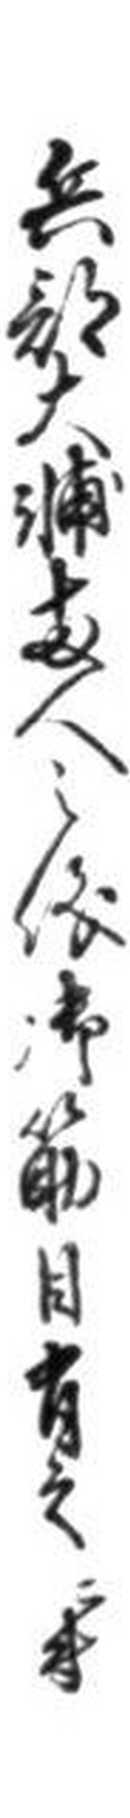兵部大輔両人之儀御筋目有之ニ付
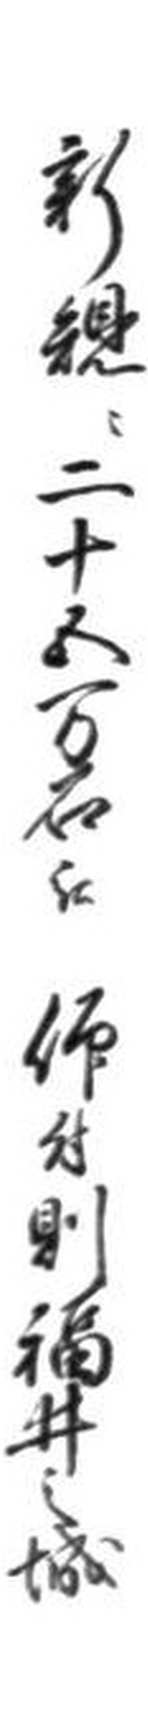新規ニ二十五万石被仰付則福井之城
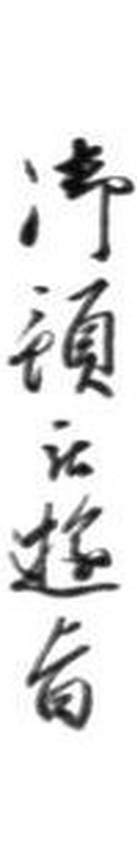御預被遊旨
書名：家譜 十六 吉品公 従貞享三年閏三月到同四年
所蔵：福井県文書館 Fukui Prefectural Archives
